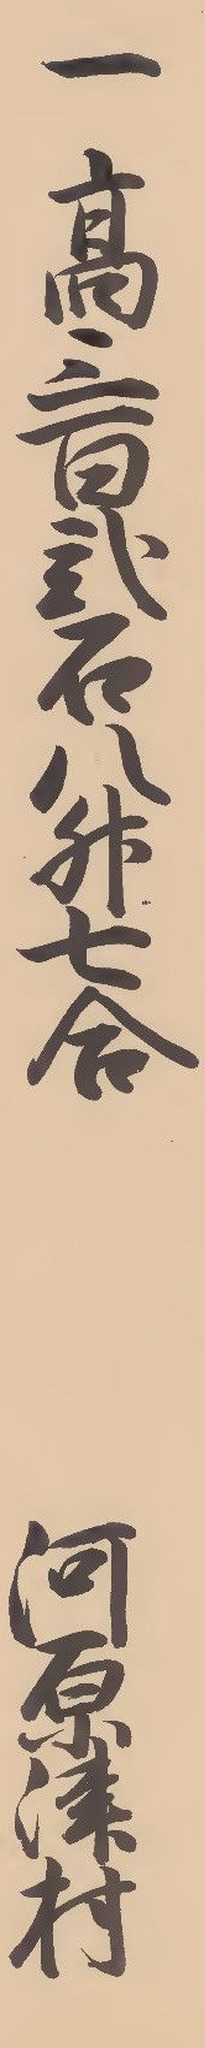一高三百弐石八升七合河原津村
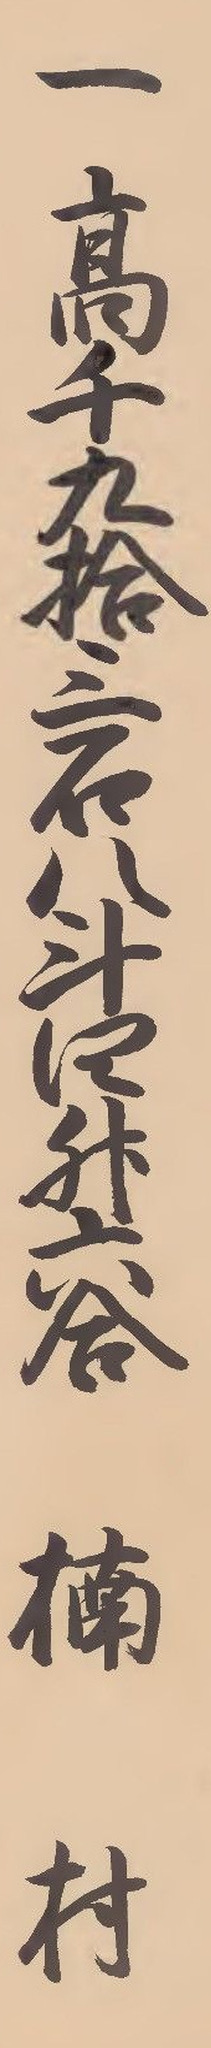一高千九拾三石八斗四升六合楠村
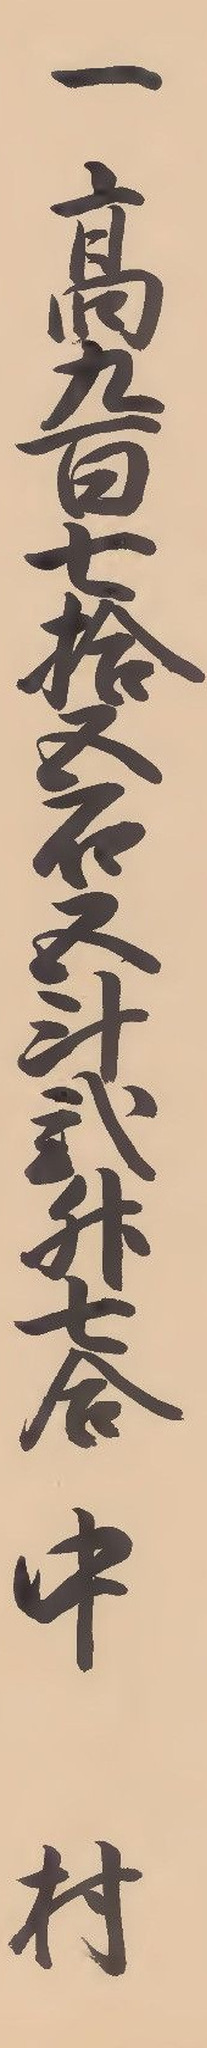一高九百七拾五石五斗弐升七合中村
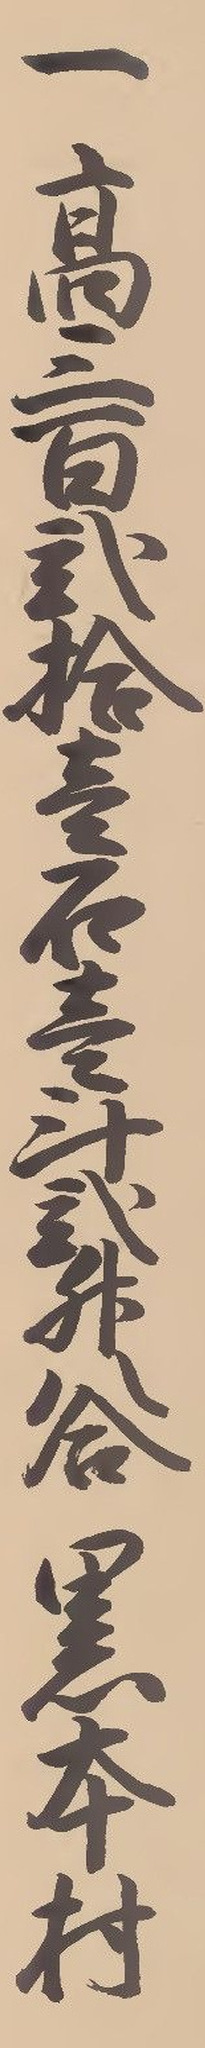一高三百弐拾壱石壱斗弐升八合黒本村
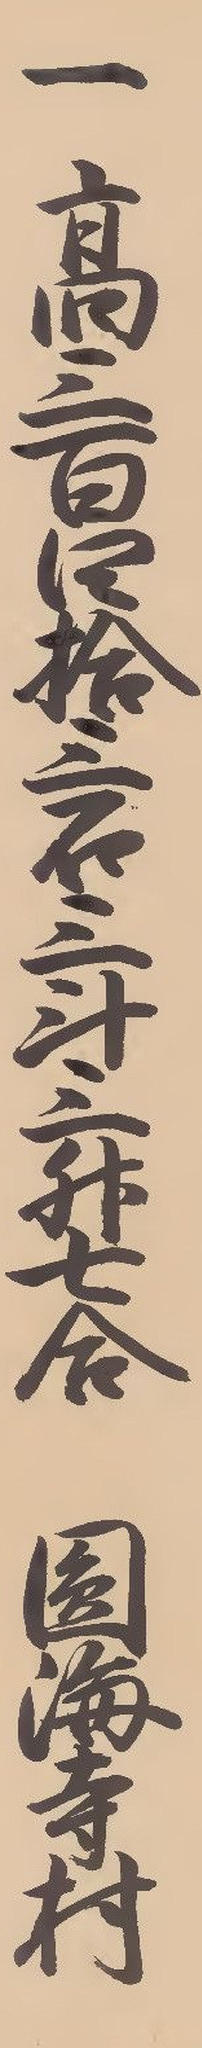一高三百四拾三石三斗三升七合円海寺村
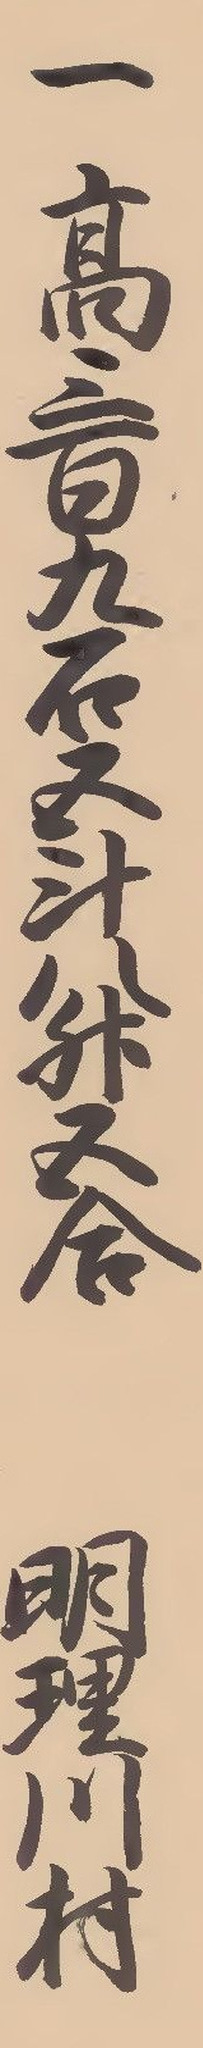一高三百九石五斗八升五合明理川村
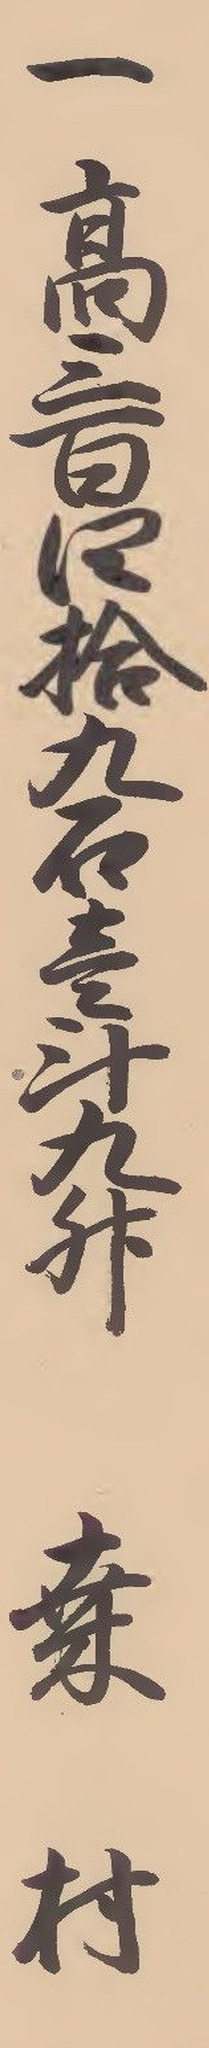一高三百四拾九石壱斗九升桑村

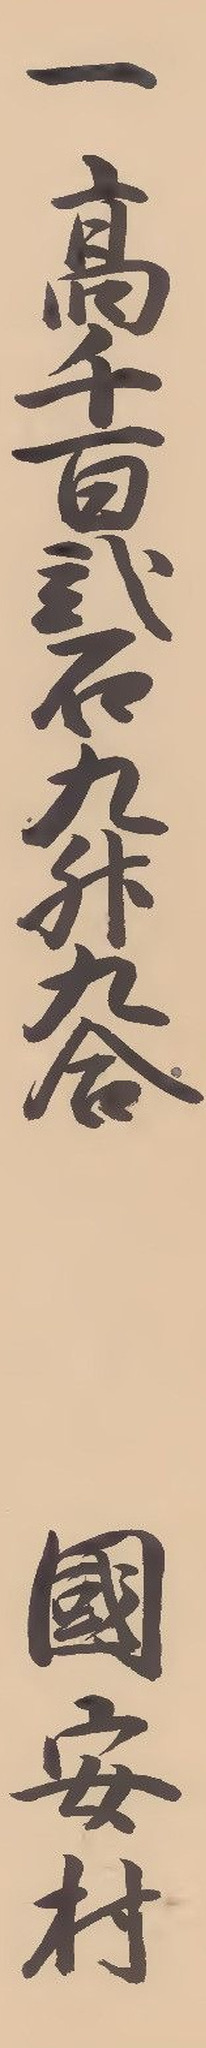一高千百弐石九升九合国安村
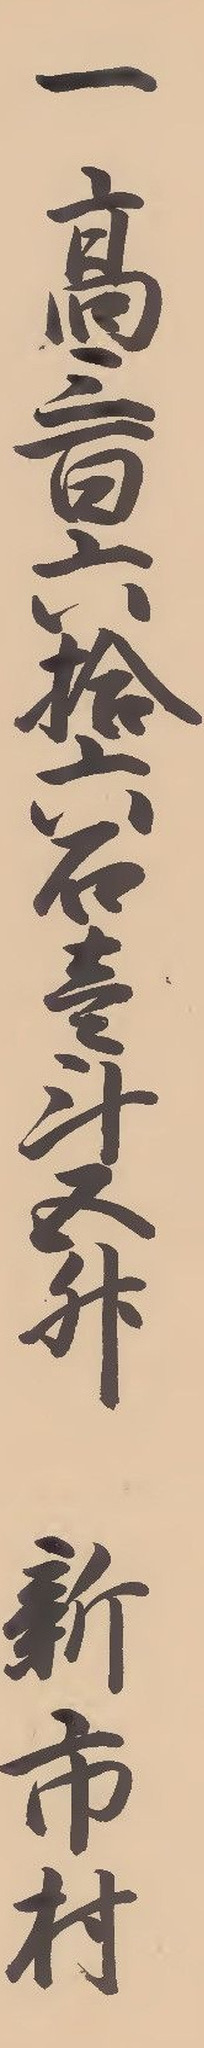一高三百六拾六石壱斗五升新市村
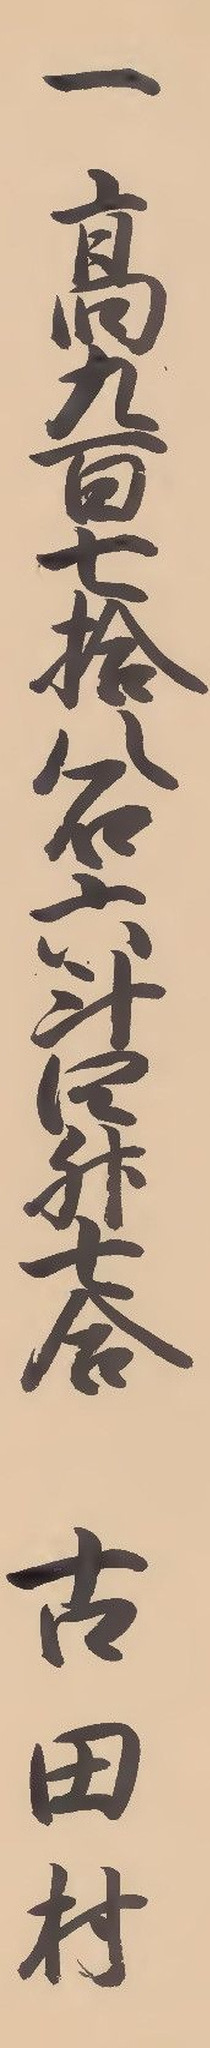一高九百七拾八石六斗四升七合古田村
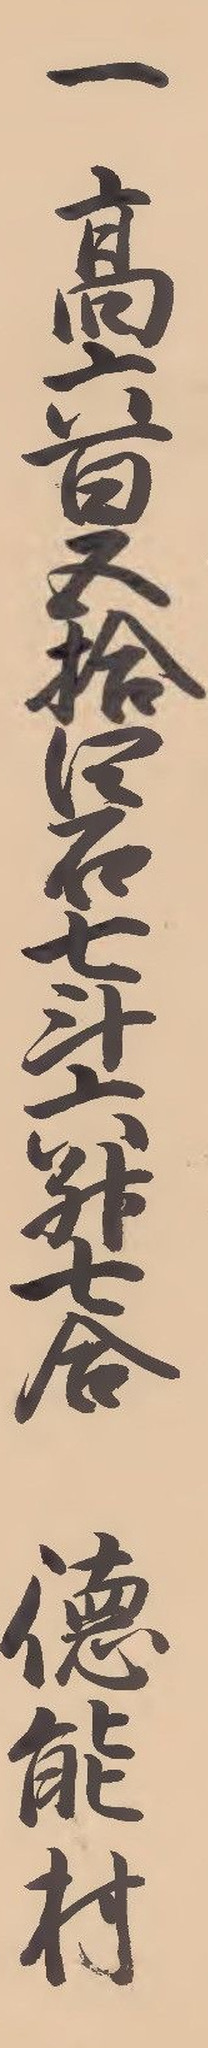一高六百五拾四石七斗六升七合徳能村
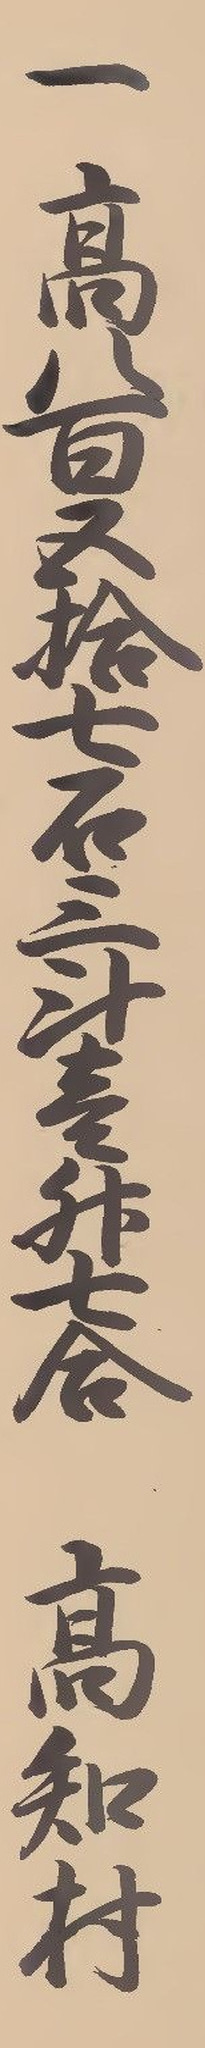一高八百五拾七石三斗壱升七合高知村
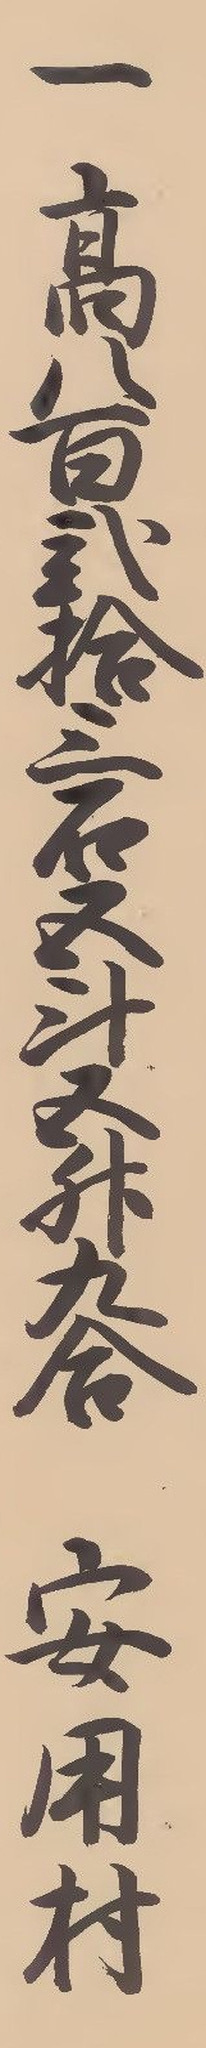一高八百弐拾三石五斗五升九合安用村
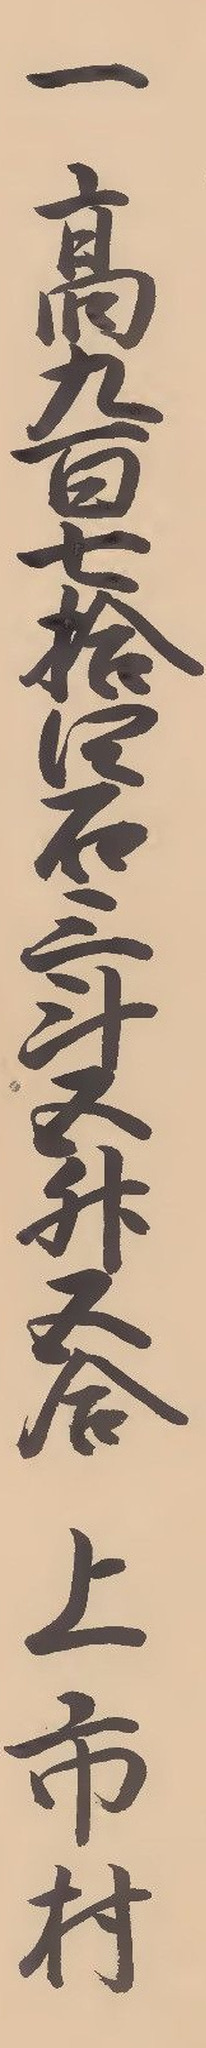一高九百七拾四石三斗五升五合上市村

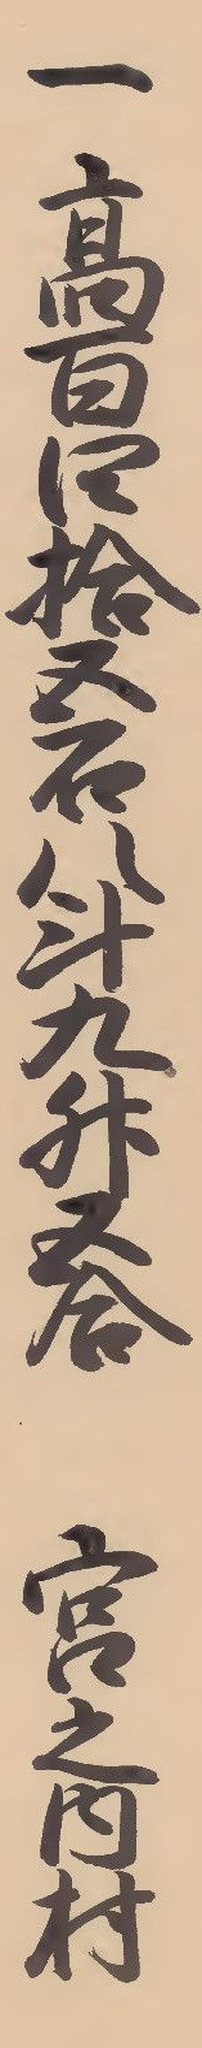一高百四拾五石八斗九升五合宮之内村
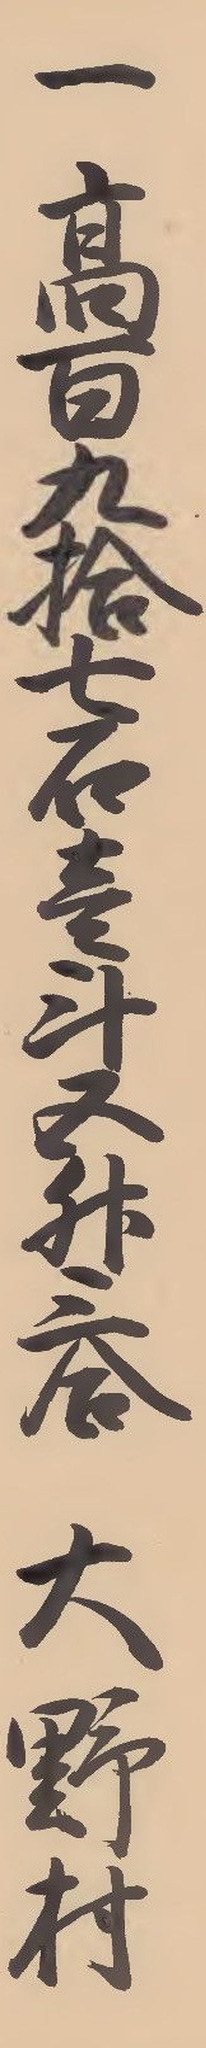一高百九拾七石壱斗五升三合大野村
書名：伊予国郷帳
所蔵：国立公文書館 National Archives of Japan
